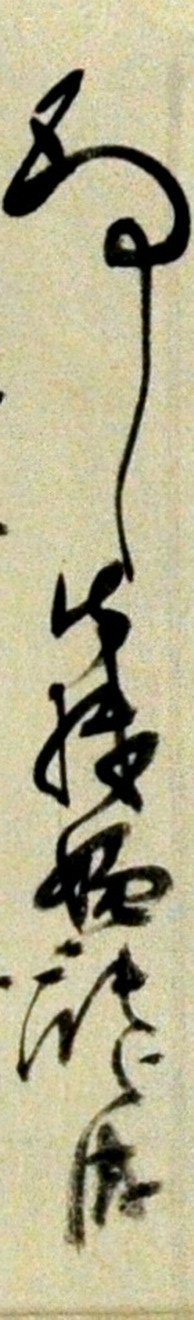尚々御機嫌能被成
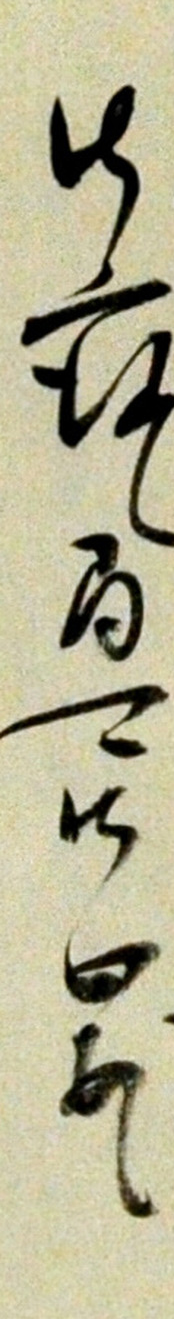御座候間可御心安候
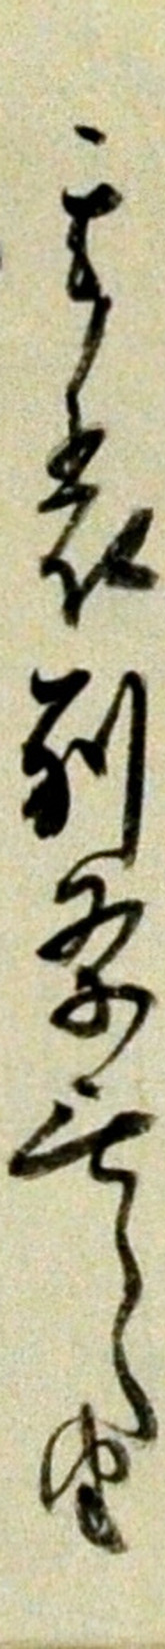其表別条無之由
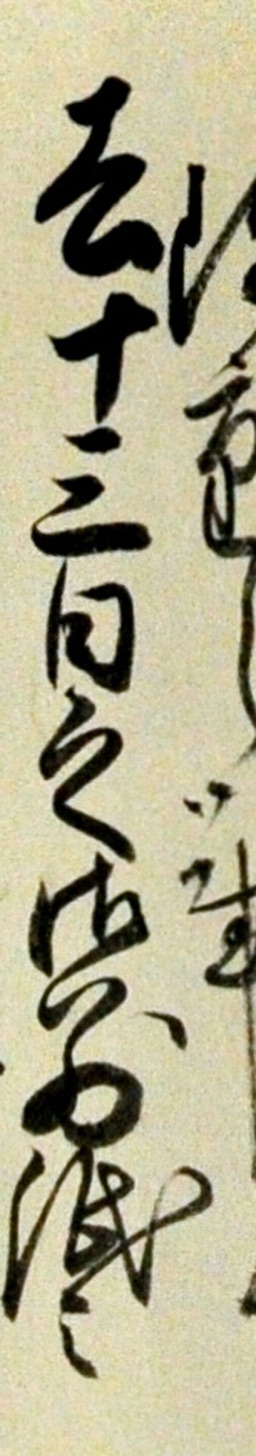去十三日之御別紙令
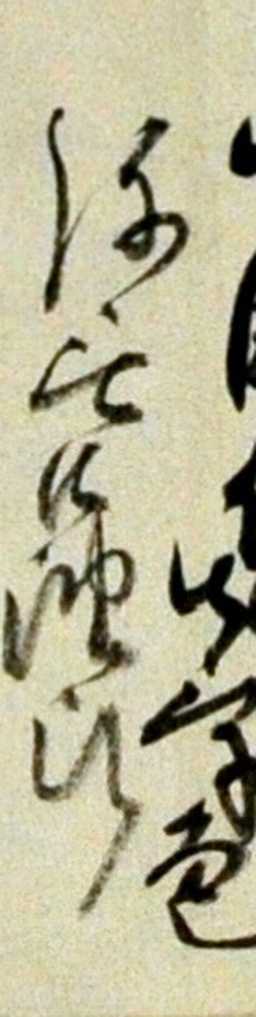弥無御油断
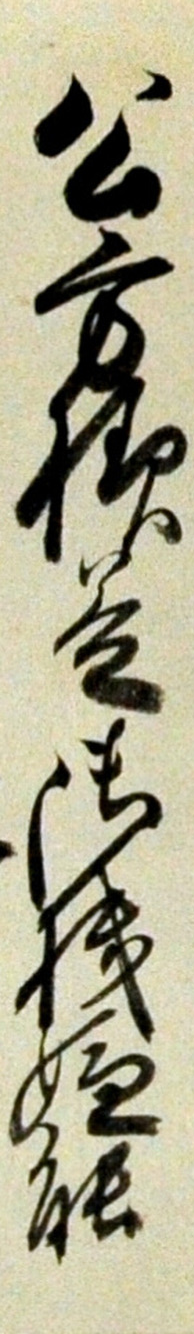公方様益御機嫌能
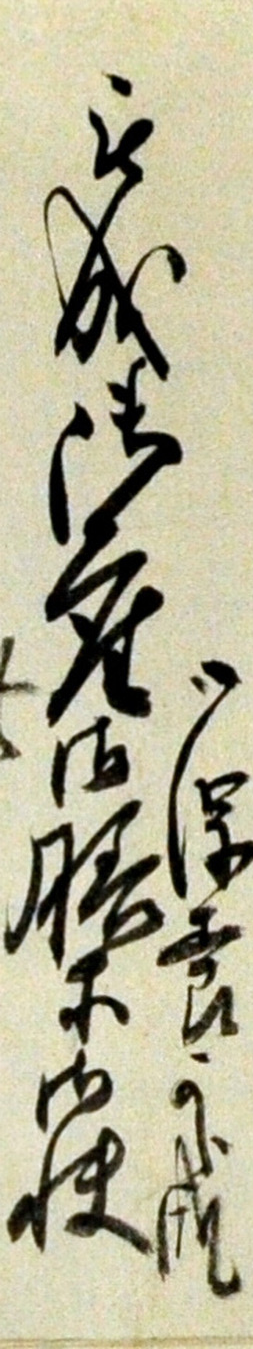被成御座御膳等御快
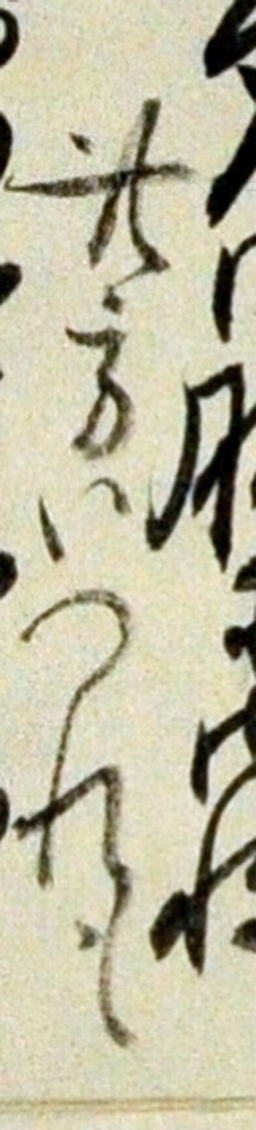此方いつれも
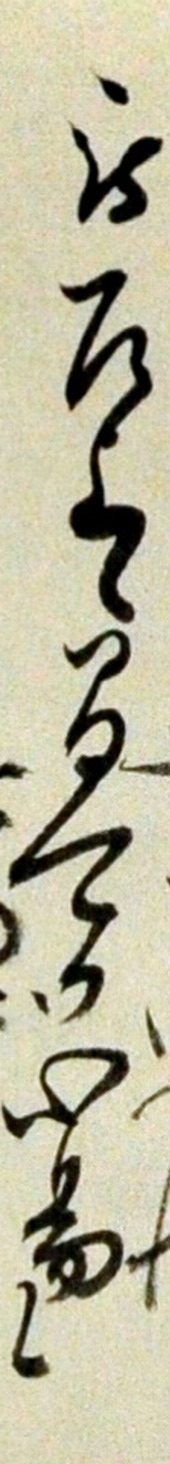被召上候間可御心易候
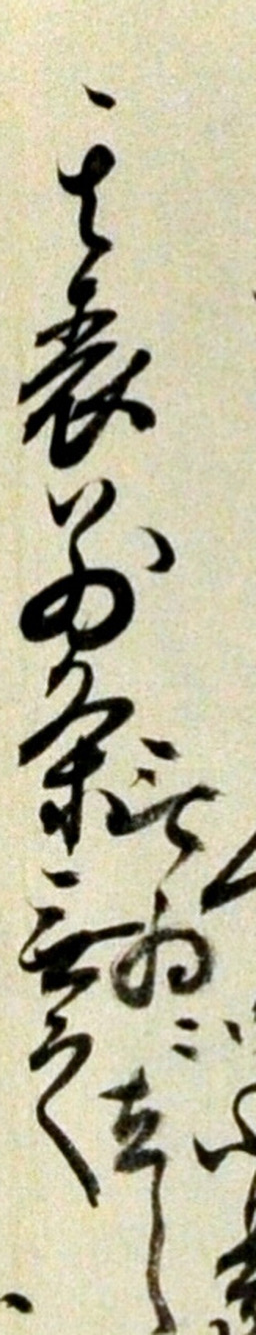其表別条無之
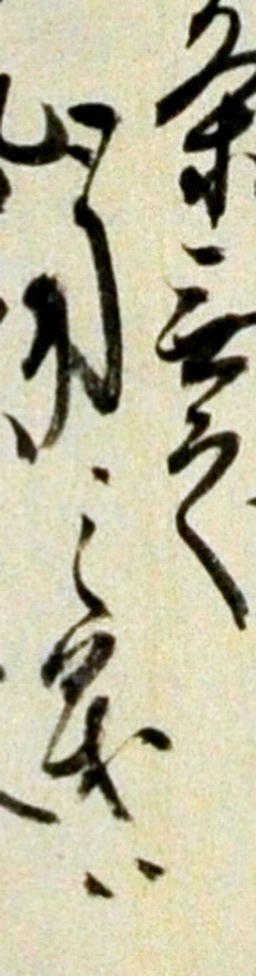御用之義は
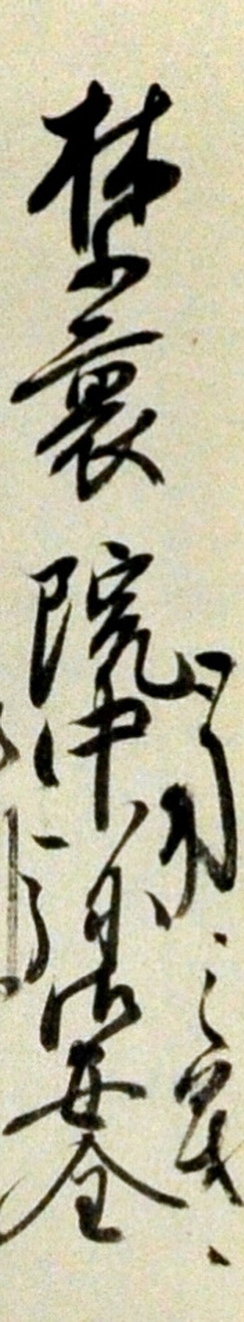禁裏院中弥御安全
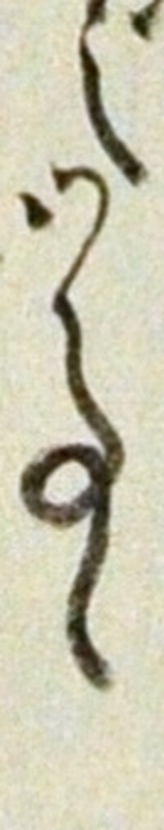御事候
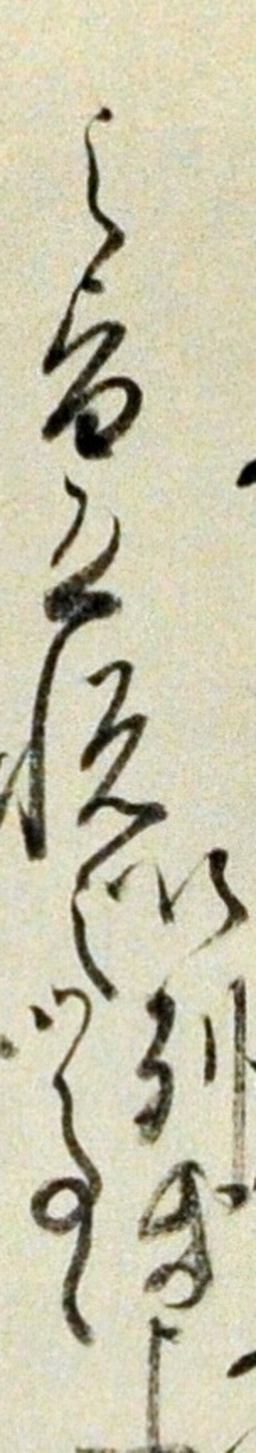之旨恐悦之御事候
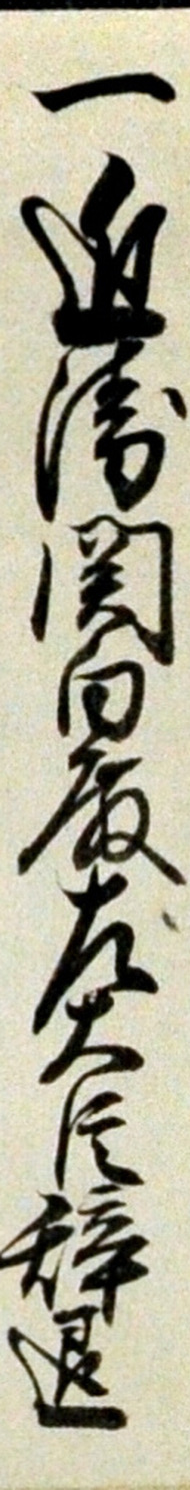一近衛関白殿左大臣辞退
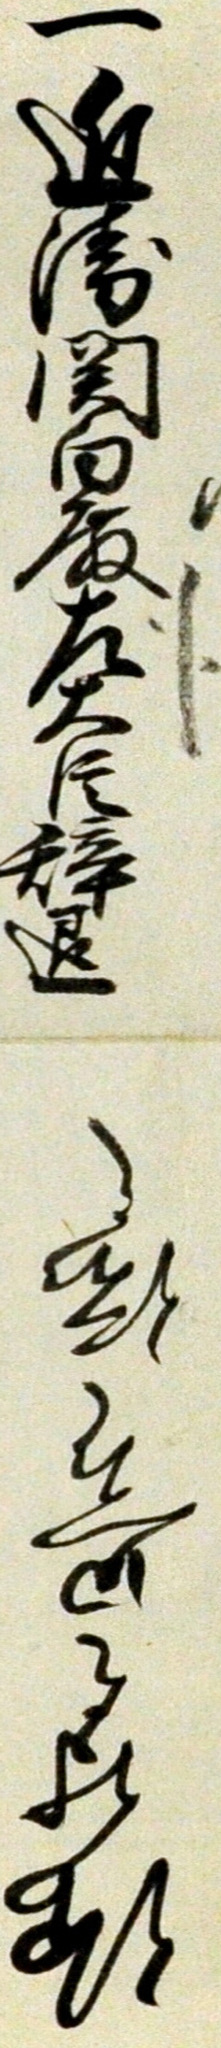一近衛関白殿左大臣辞退
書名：書状
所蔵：伊那市立高遠町図書館・合同会社AMANE
